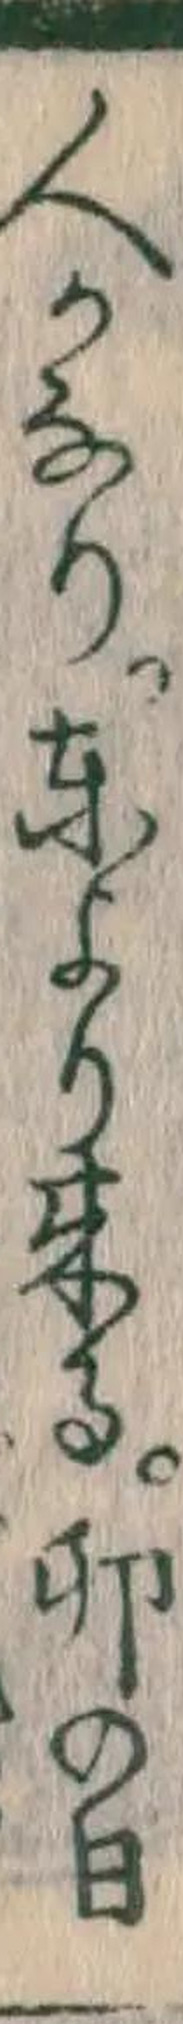人かなり。東より来る。卯の日
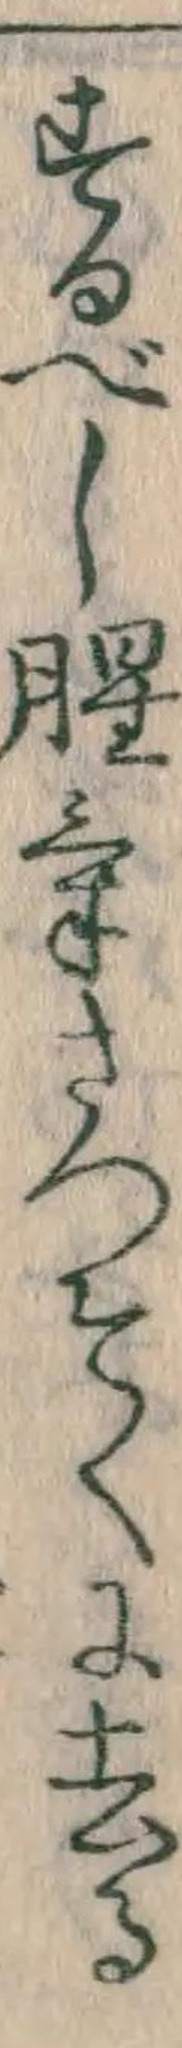するべし腥気さつそくに去る
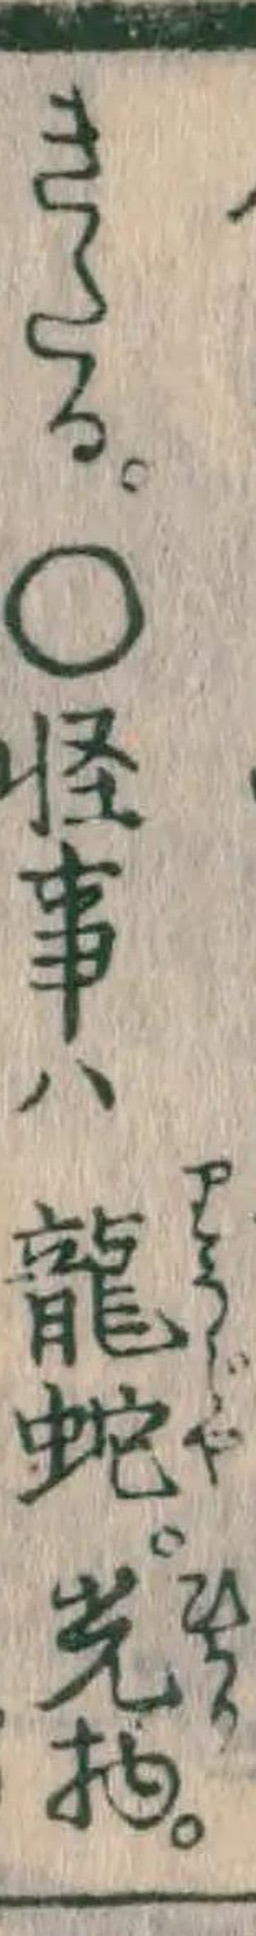きたる。○怪事は竜蛇。光物。
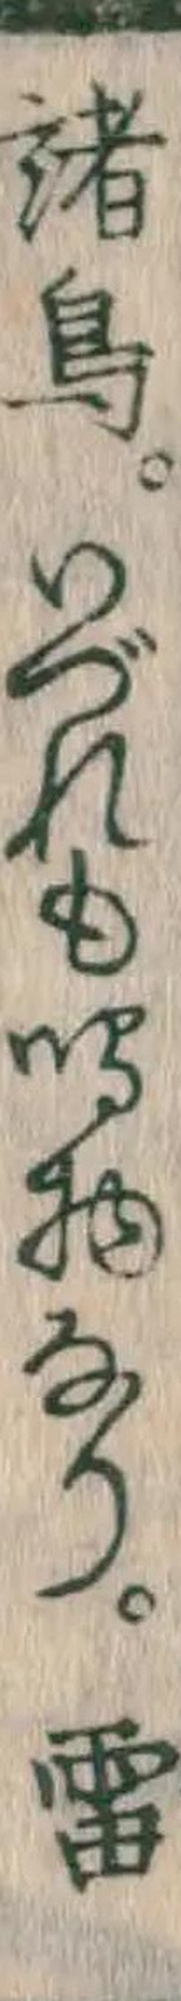諸鳥。いづれも鳴物なり。雷
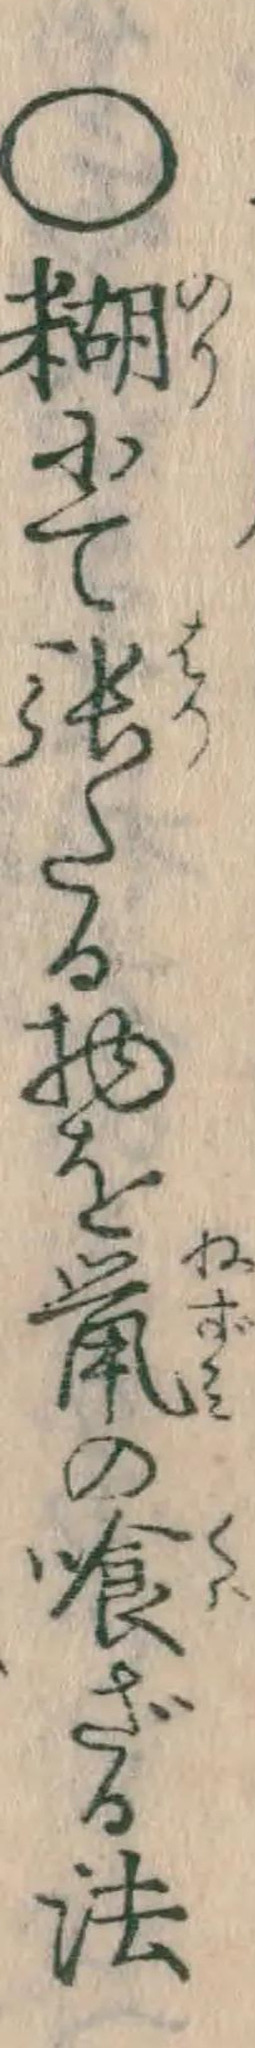○糊にて張たる物を鼠の喰ざる法
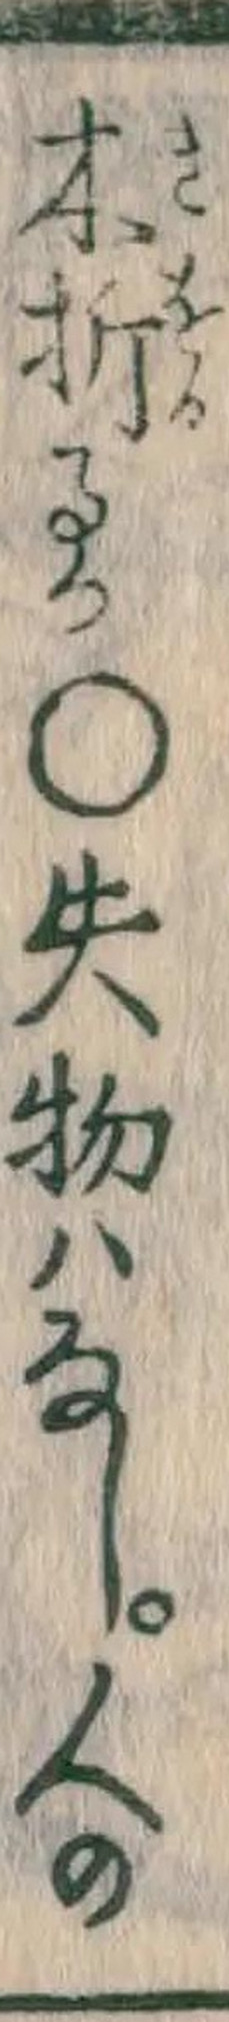木折事か○失物はなし。人の
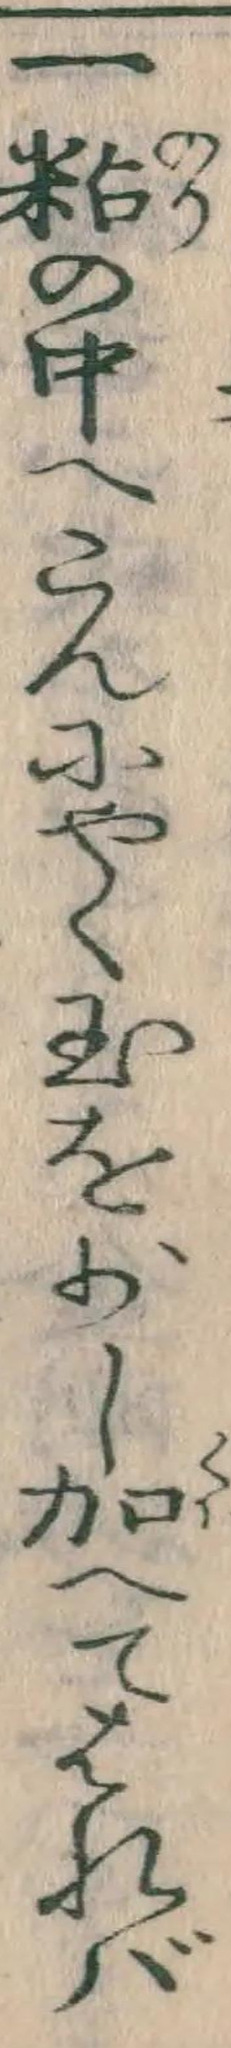一粘の中へこんにやく玉を少し加へてはれば
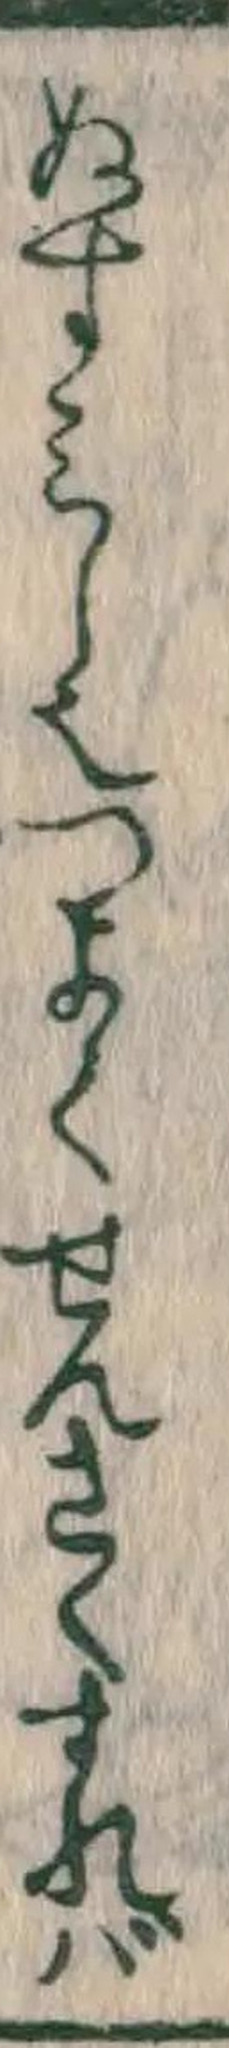ぬすみし也つよくせんさくすれば
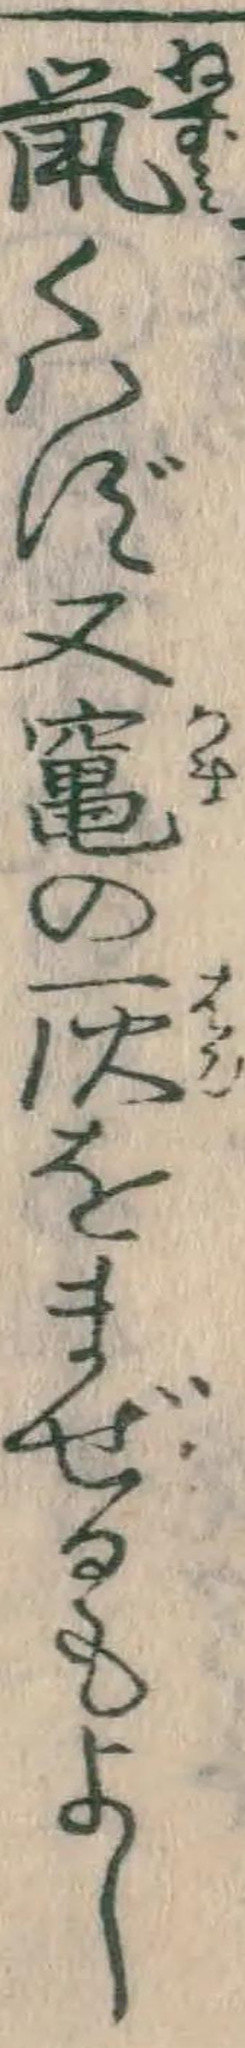鼠くはず又竈の灰をまぜるもよし
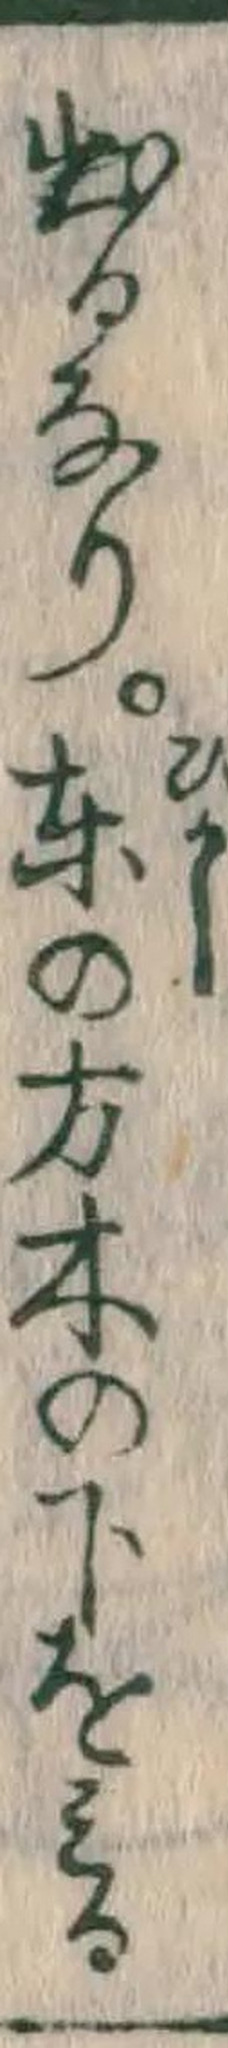出るなり。東の方木の下をみる
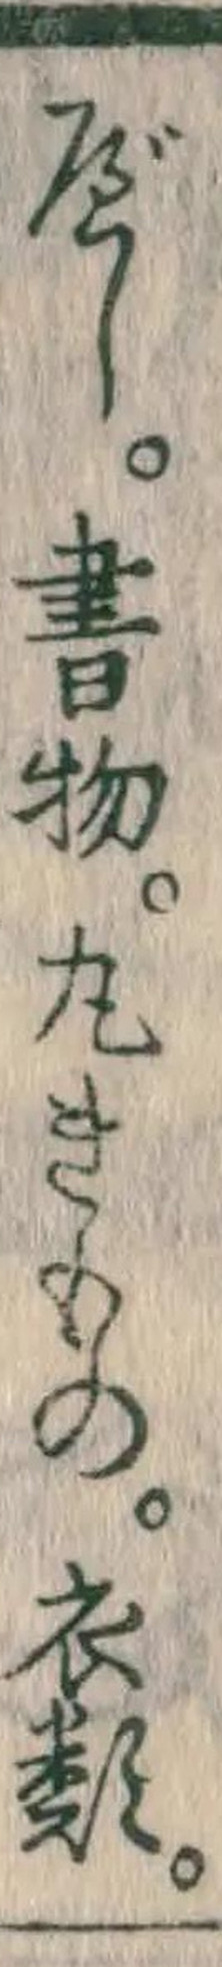べし。書物。丸きもの。衣類。
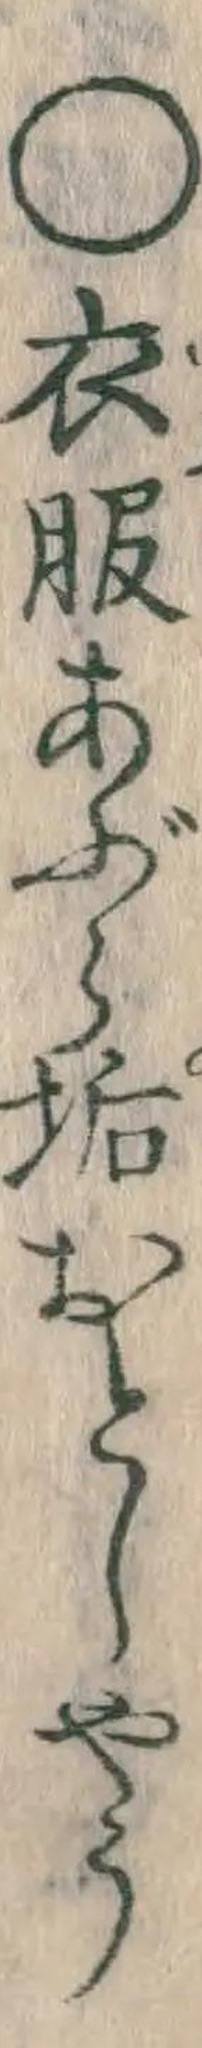○衣服あぶら垢おとしやう
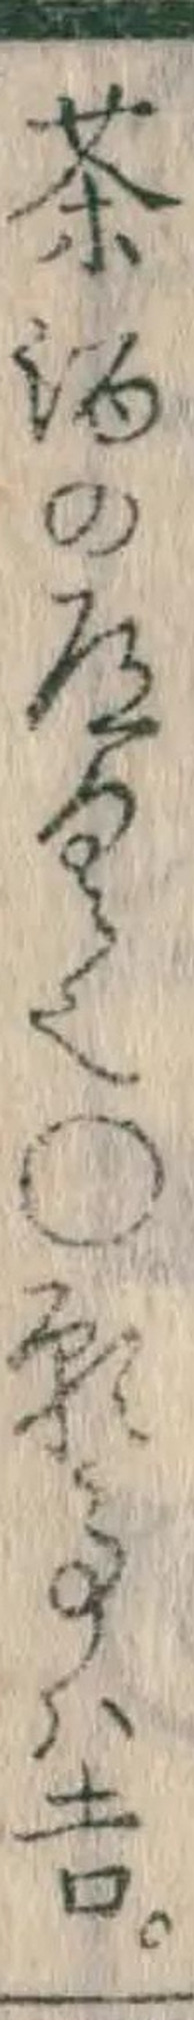茶酒の道具也。○願事は吉。
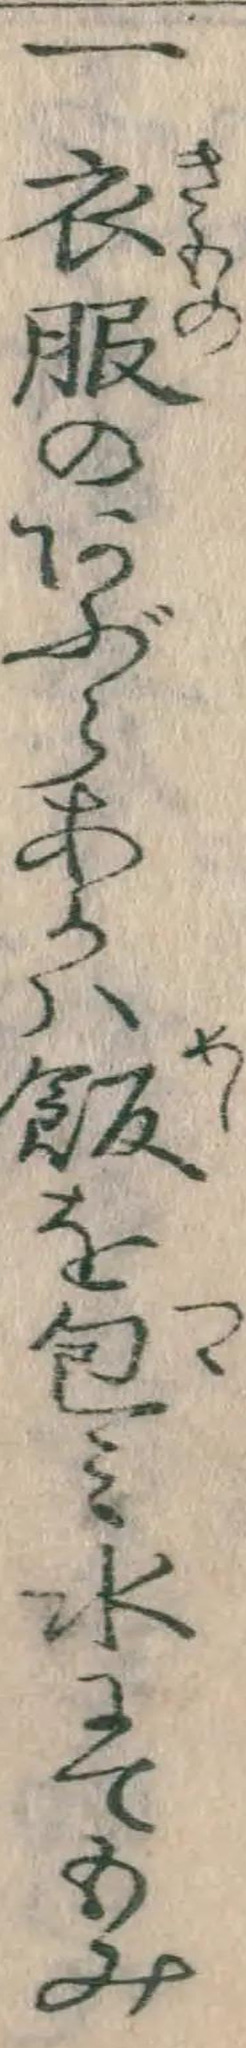一衣服のあぶらあかは飯を包み水にてもみ
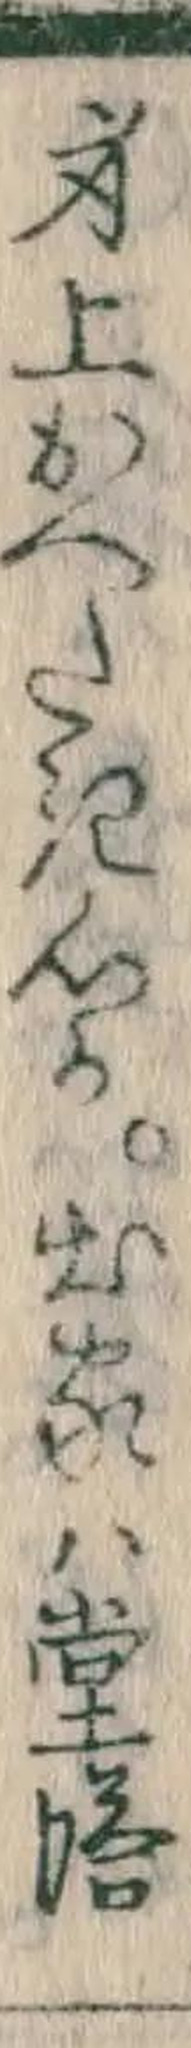身上かへたき心か。出家は堂塔
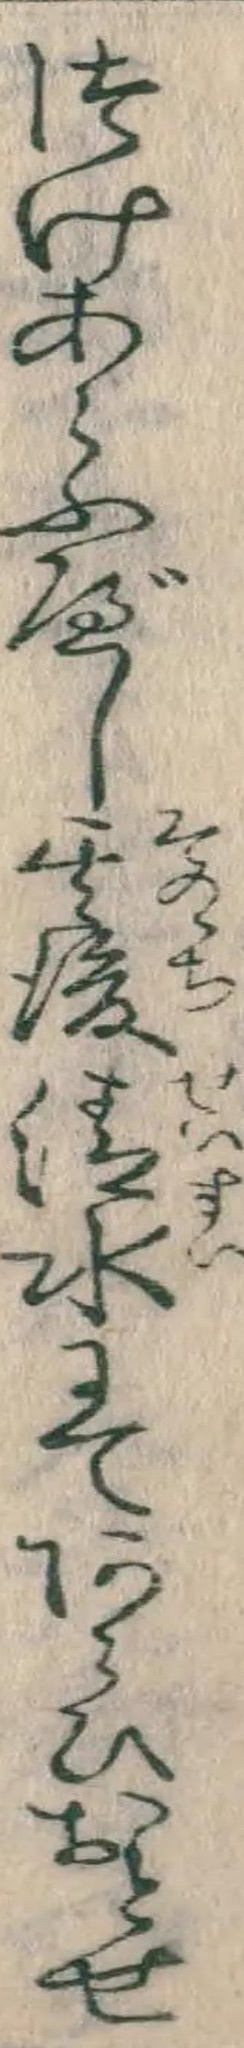つけあらふべし其後清水にてあらひおとせ
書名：広益秘事大全 3巻. [1]
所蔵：国立国会図書館 National Diet Library, JAPAN
